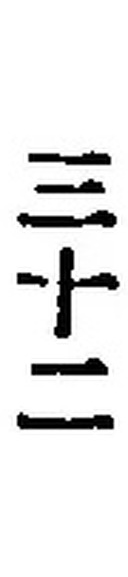三十二
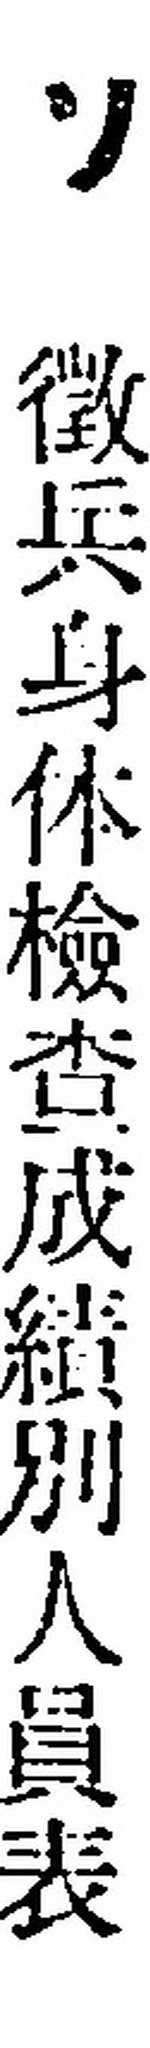ソ徴兵身体檢査成績別人員表
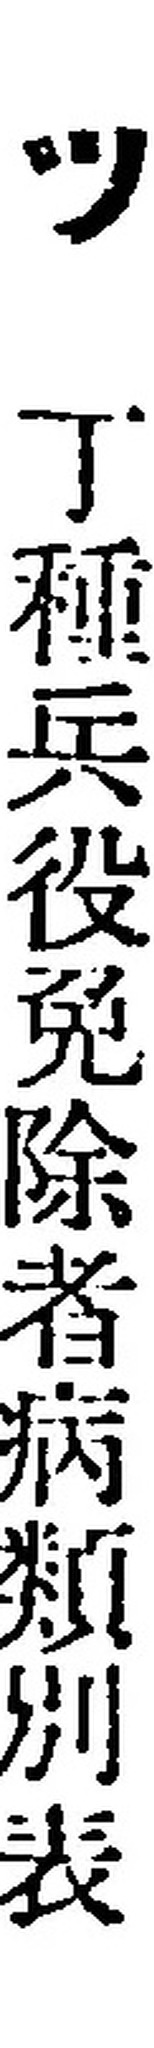ツ丁種兵役免除者病類別表
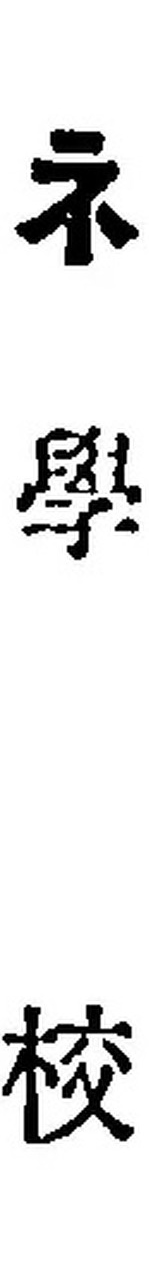ネ學校
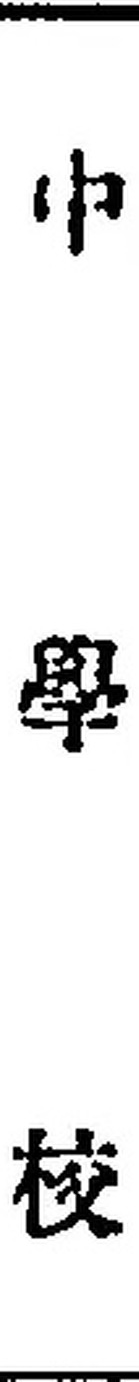ネ學校
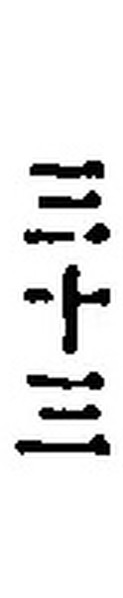三十三

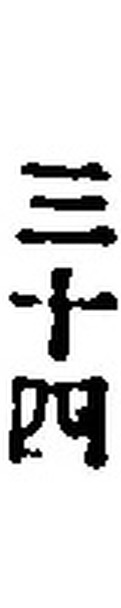三十四
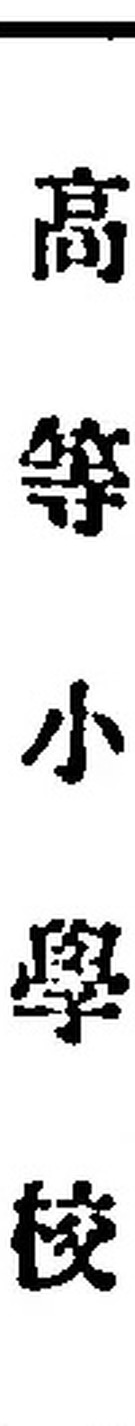高等女學校
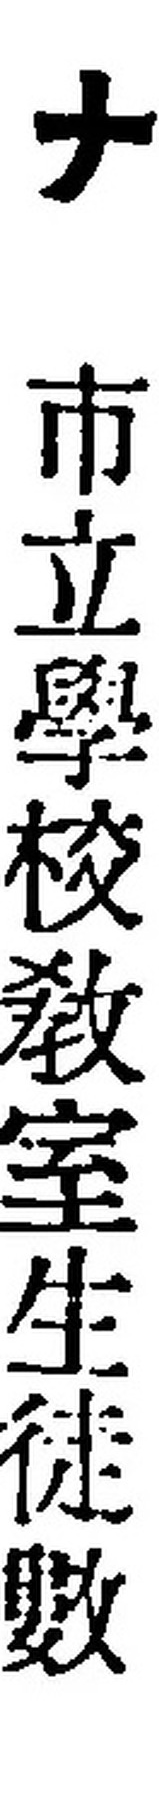ナ市立學校敎室生徒數
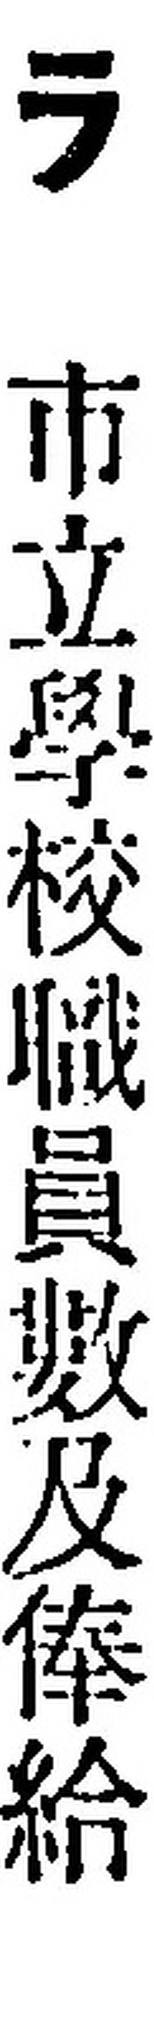ラ市立學校職員數及俸給
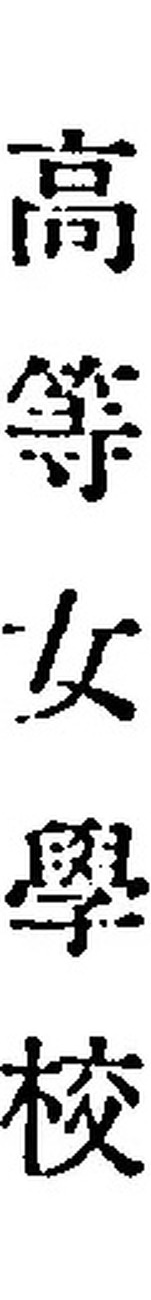高等女學校
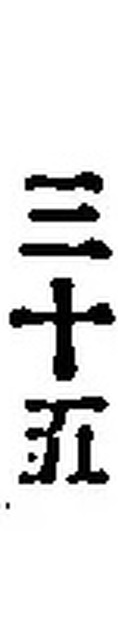三十五

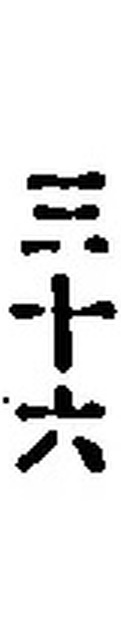三十六
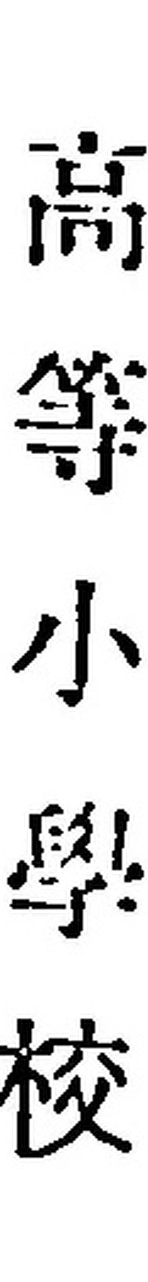高等小學校
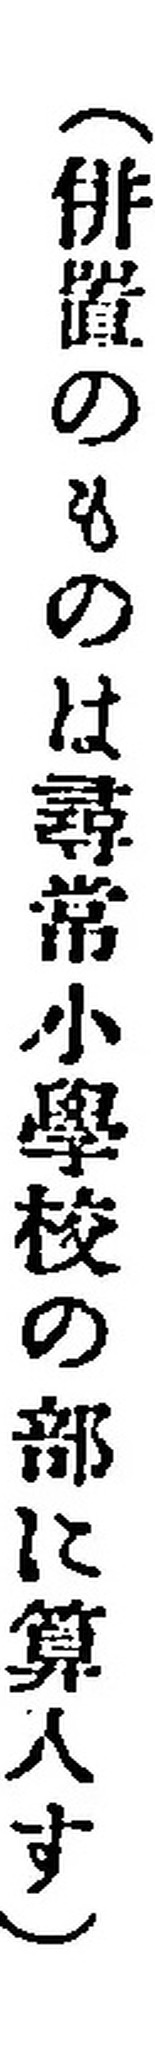(併置のものは尋常小學校の部に算入す)
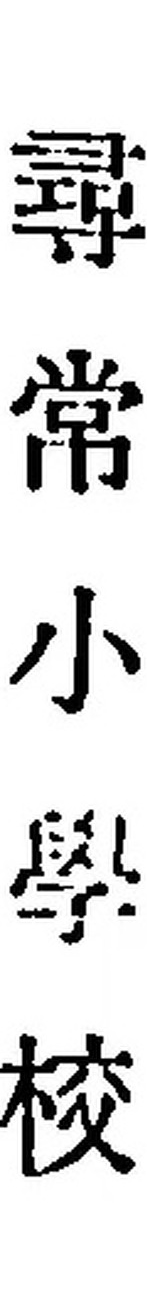尋常小學校
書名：豊橋志要
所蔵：国立国会図書館 National Diet Library, JAPAN
